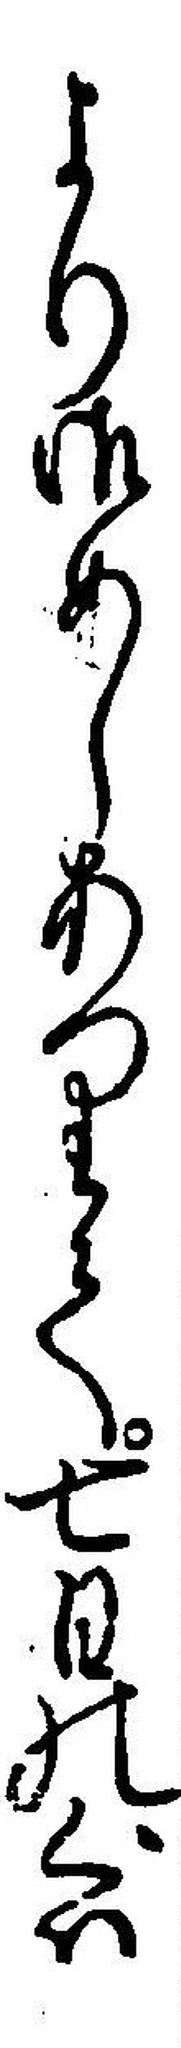より御めしありて。七日のくは
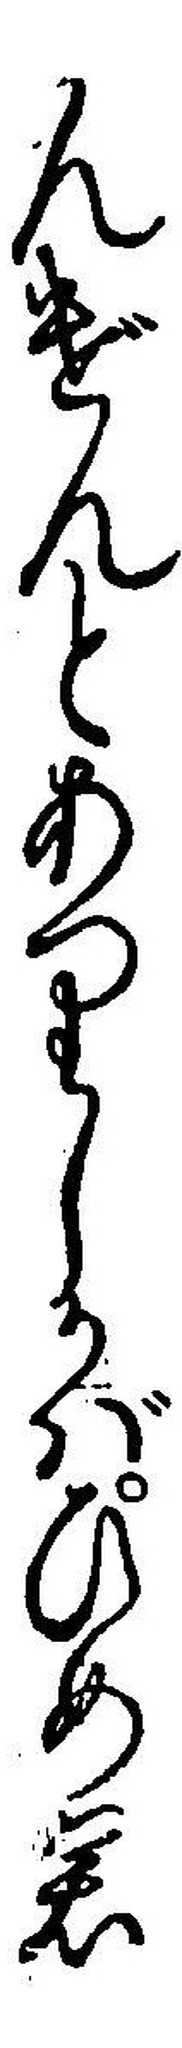んげんとありしかば。ひめ君
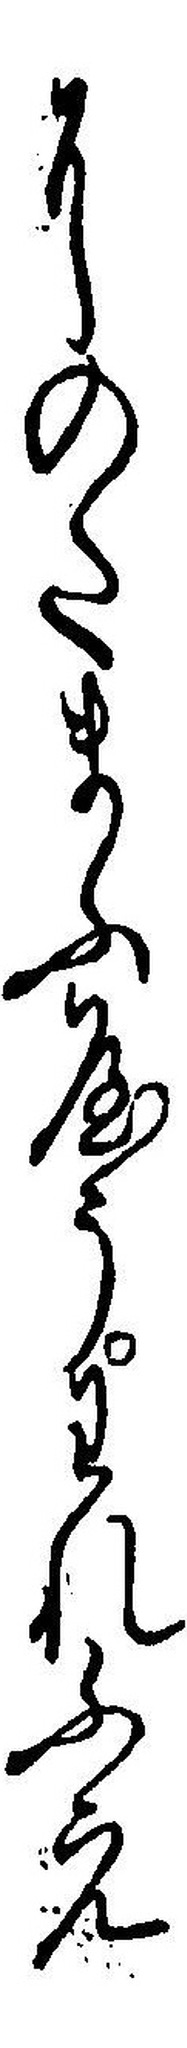にのたまふやう。われふえ
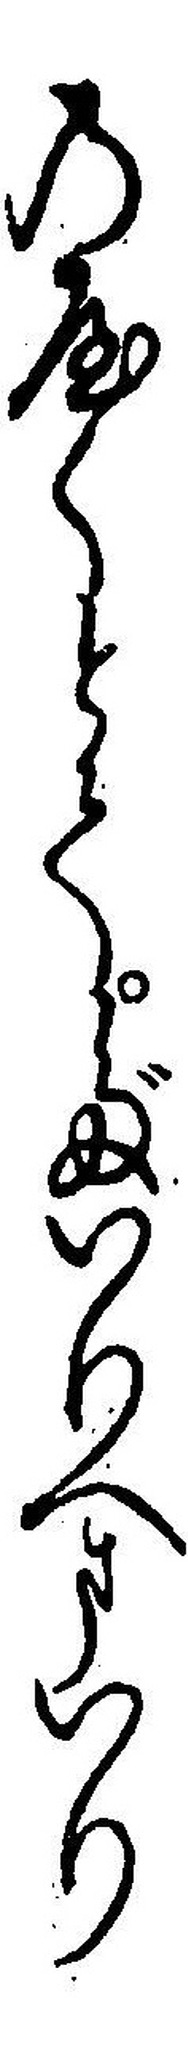のやくとて。だいりへまいり
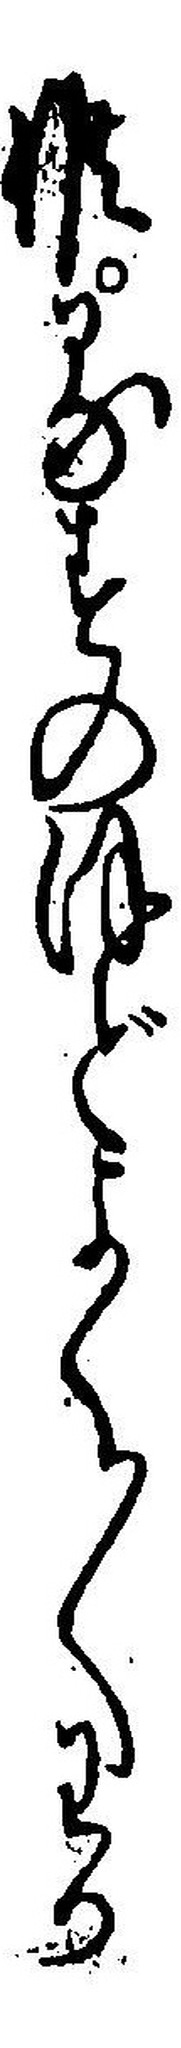候。るすのほどよく〳〵わか
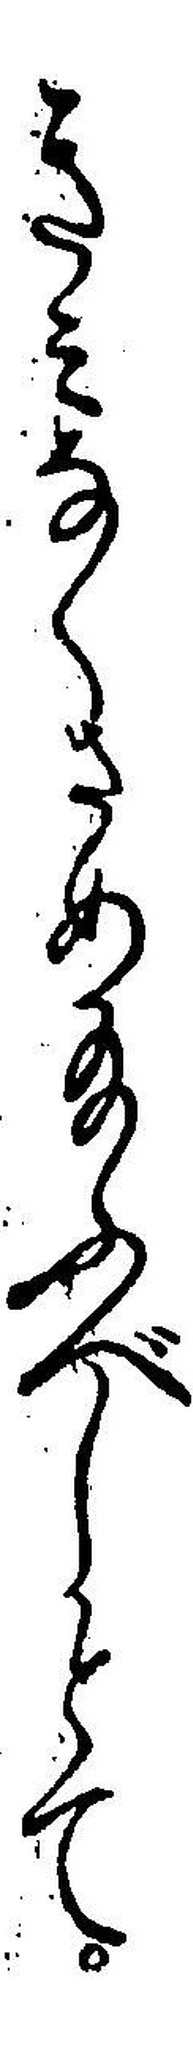きみなくさめ給ふべしとて。
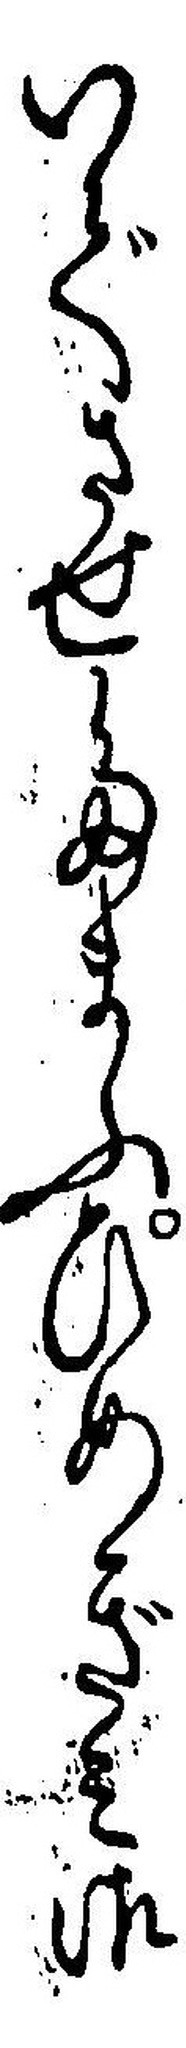いでさせたまふ。ひめぎみ御
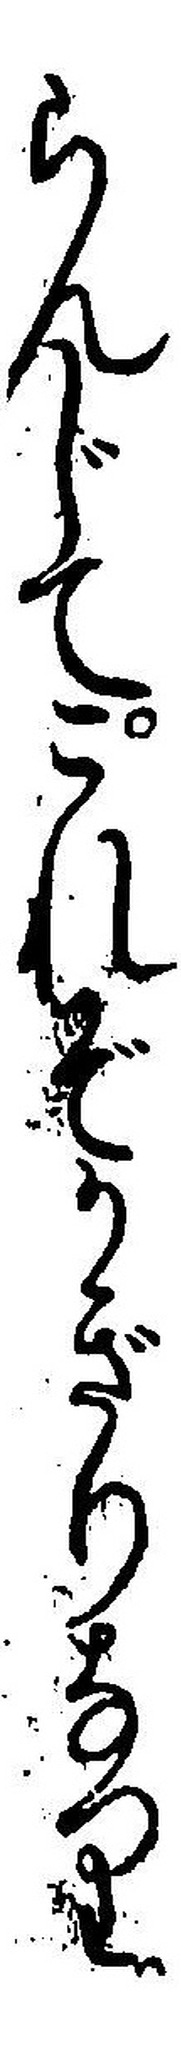らんじて。これぞかぎりなり。
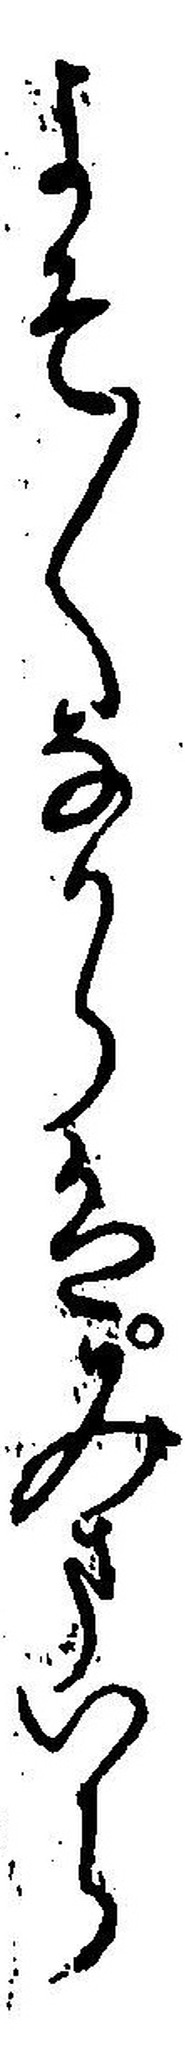よそ〳〵なからは。みまいら
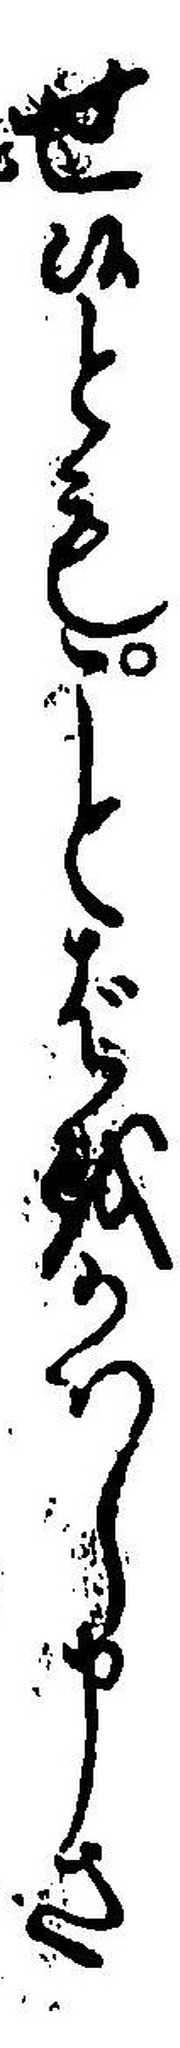せ候とも。ことばをかはし申さ
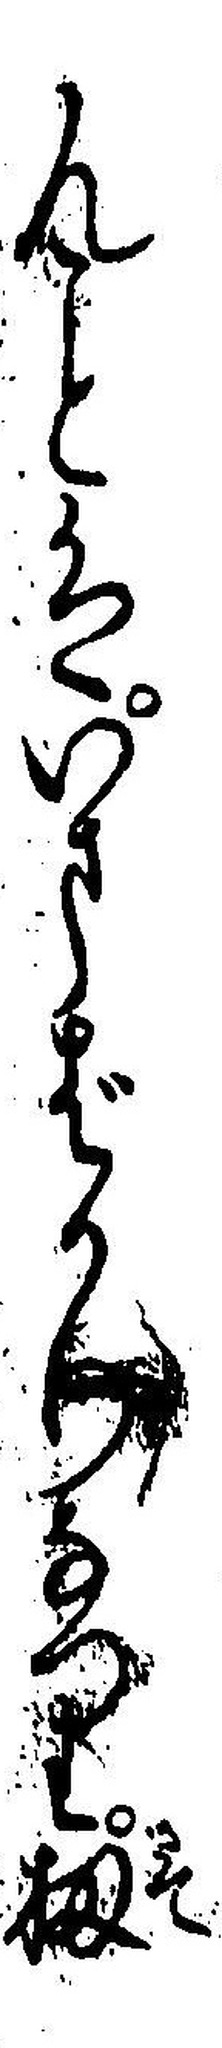んことは。いまばかりなり。扨
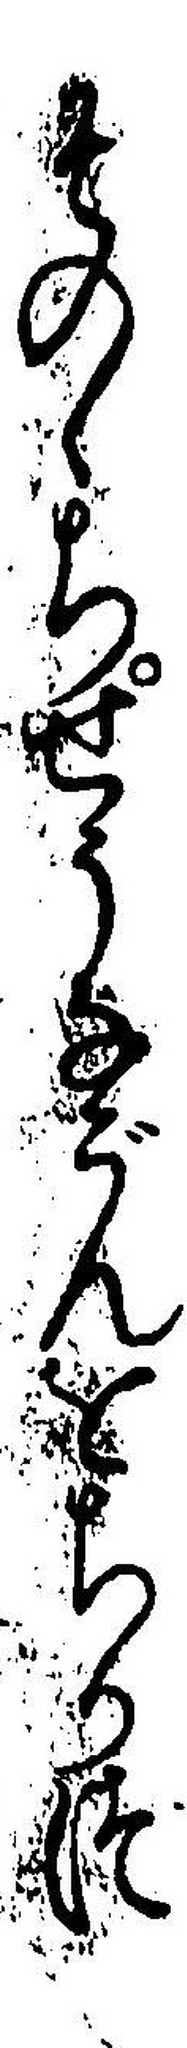そのゝち。せうなごんをちかつ
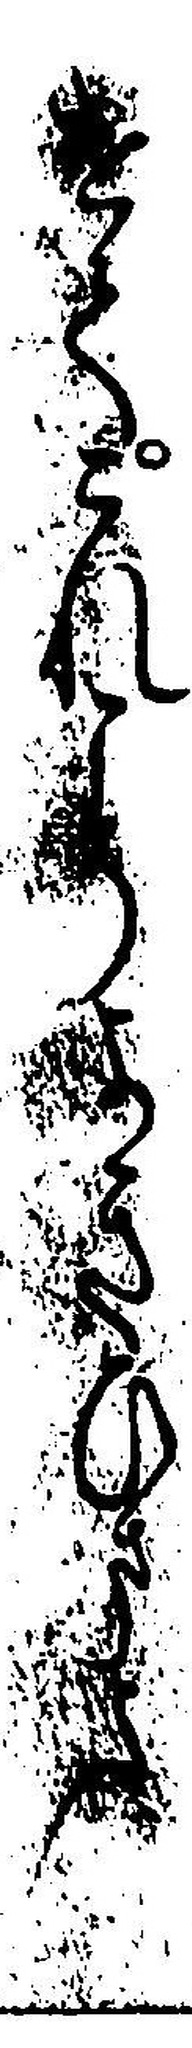けて。これこそよきひまよ

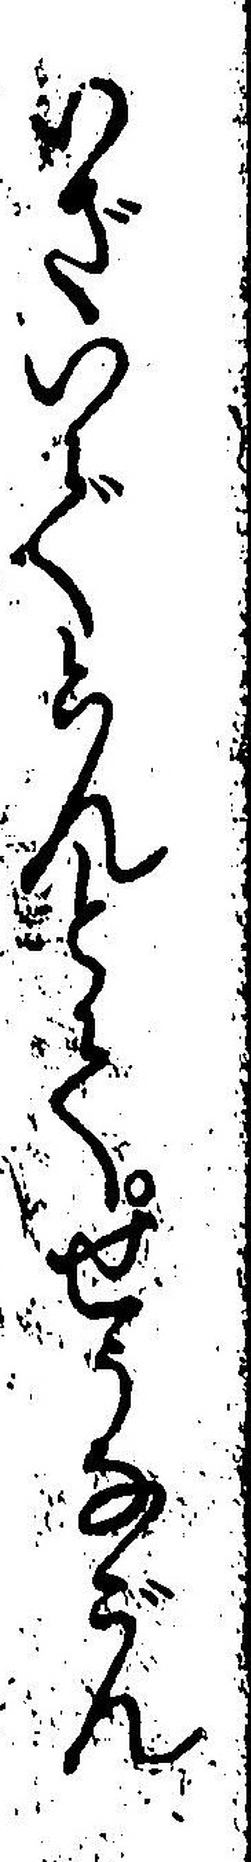いざいで候はんとて。せうなごん
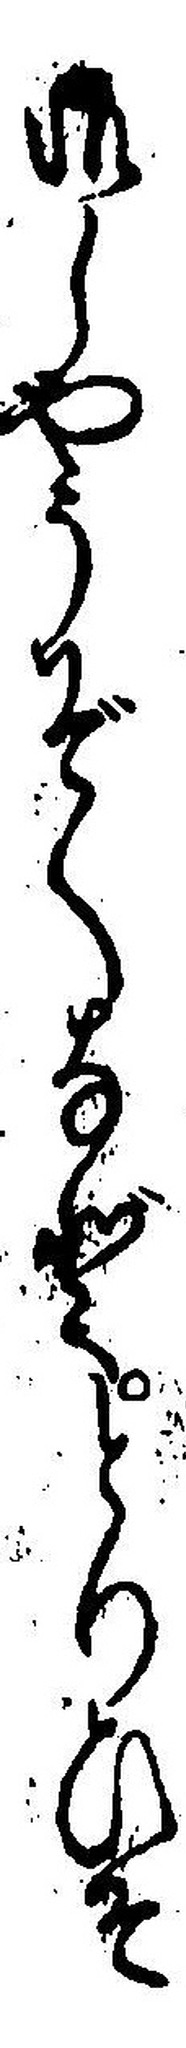御しやうぞくなど。とりひそ
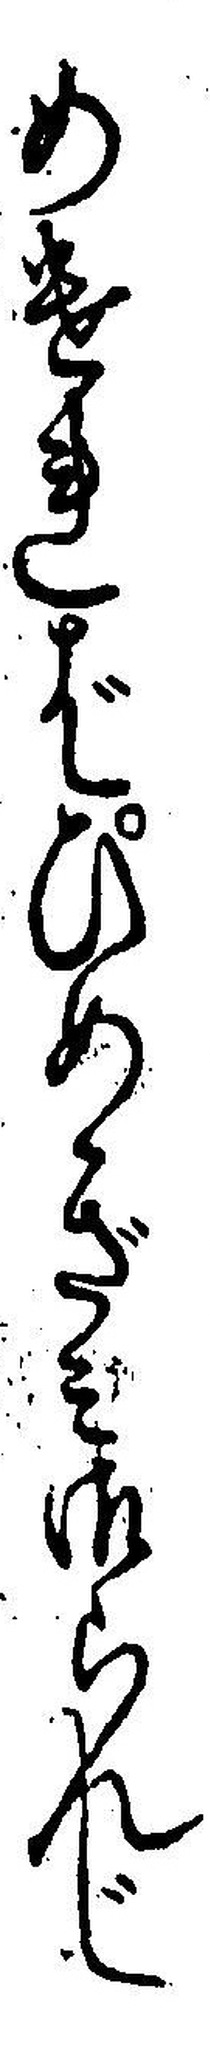めければ。ひめぎみ御らんじ
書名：木幡きつね
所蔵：東京大学総合図書館 General Library in the University of Tokyo, JAPAN
